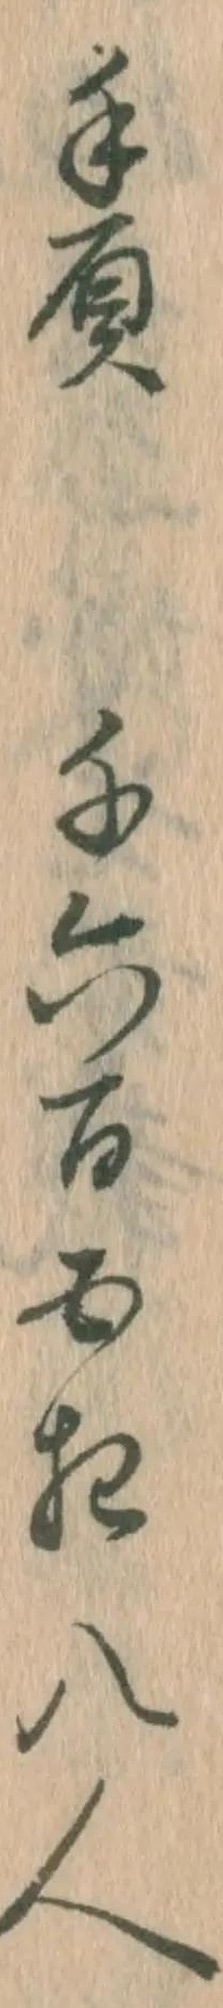手負千六百五拾八人
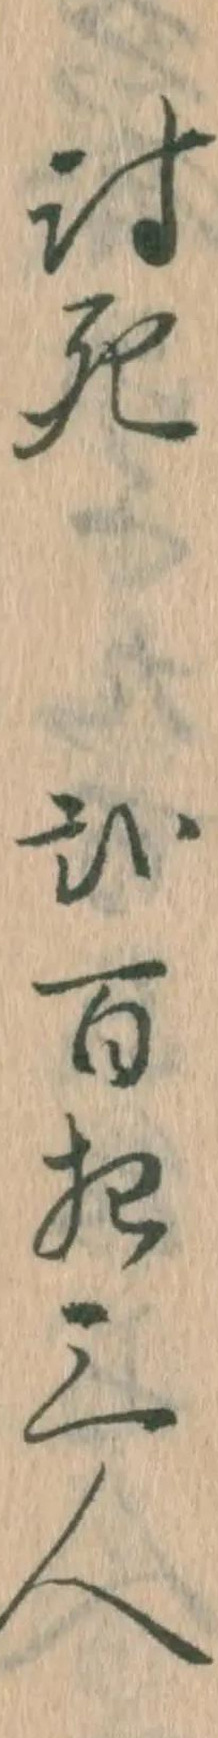討死弐百拾三人
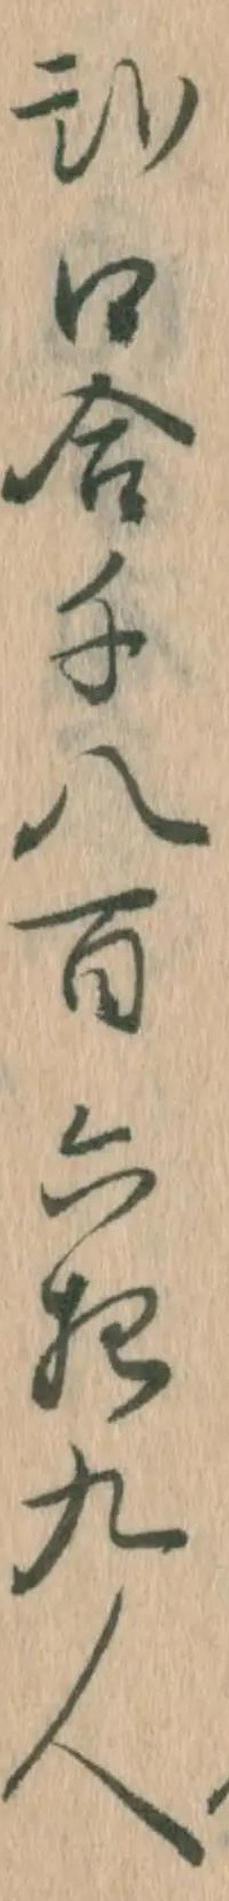弐口合千八百六拾九人
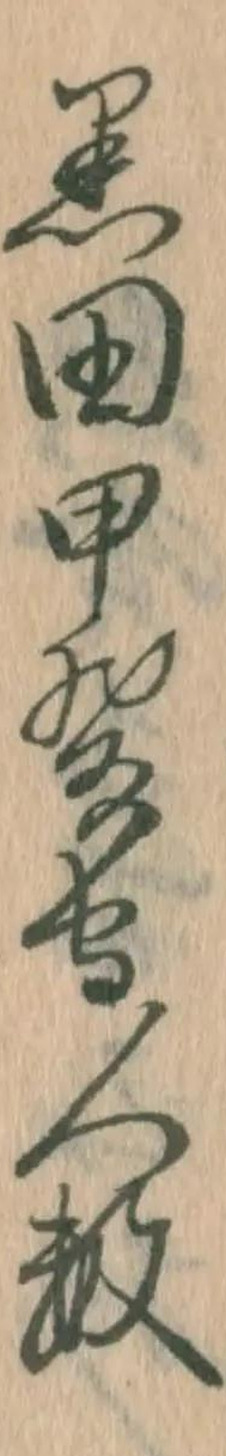黒田甲斐守人数
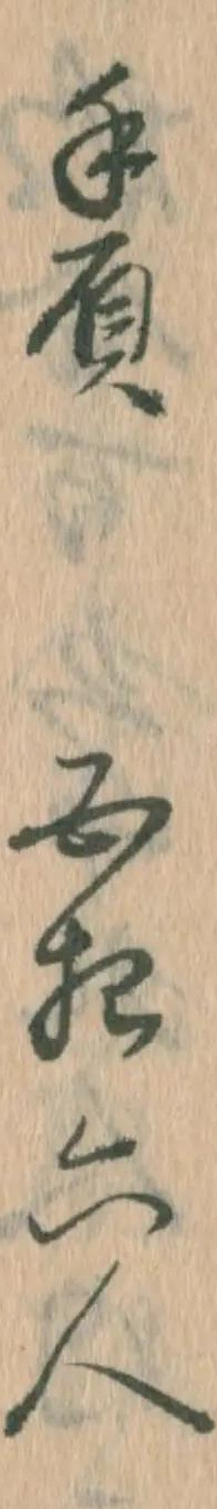手負五拾六人
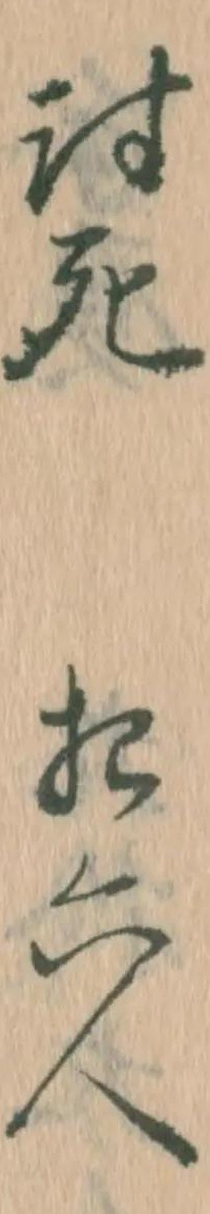討死拾六人
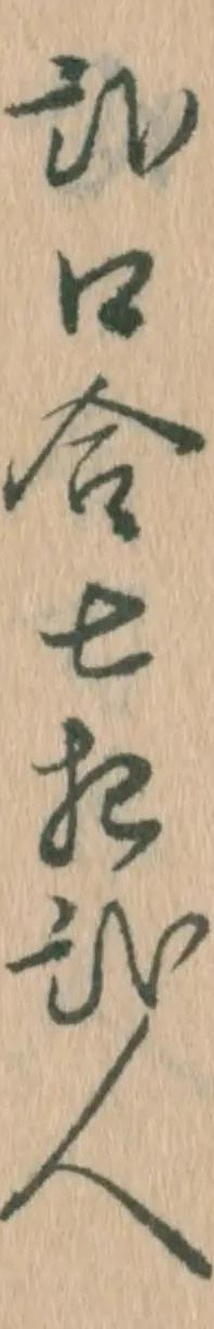弐口合七拾弐人
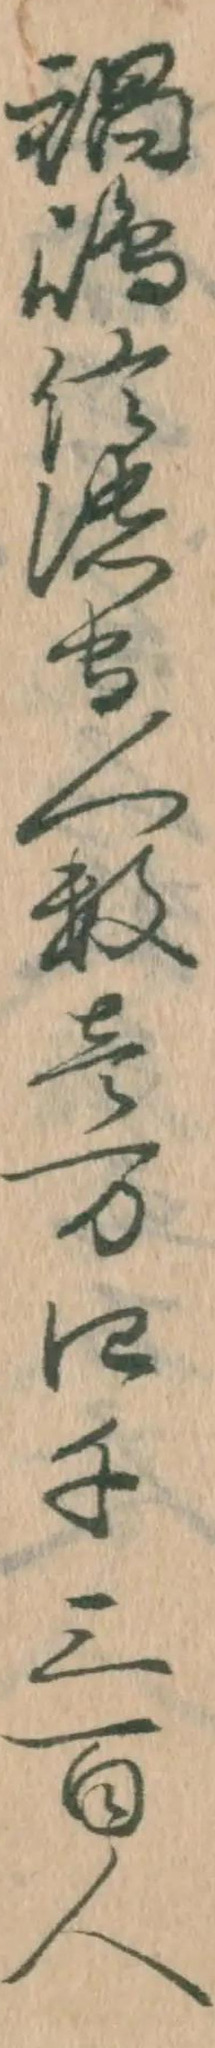鍋島信濃守人数壱万四千三百人
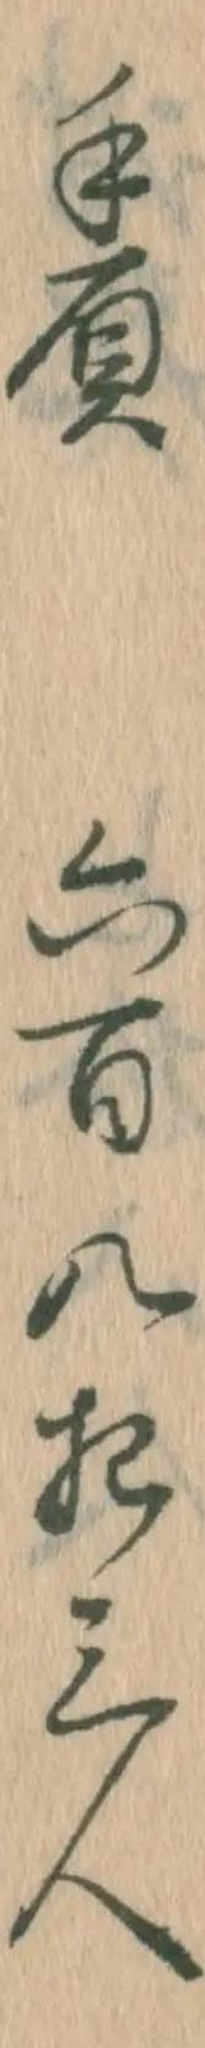手負六百八拾三人
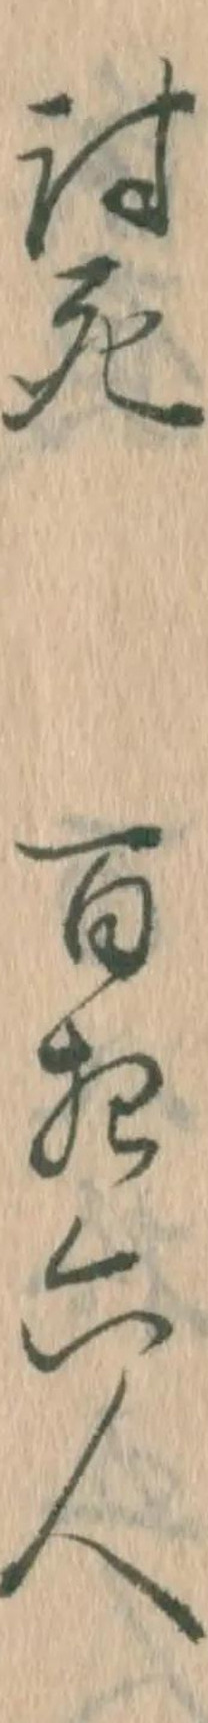討死百拾六人
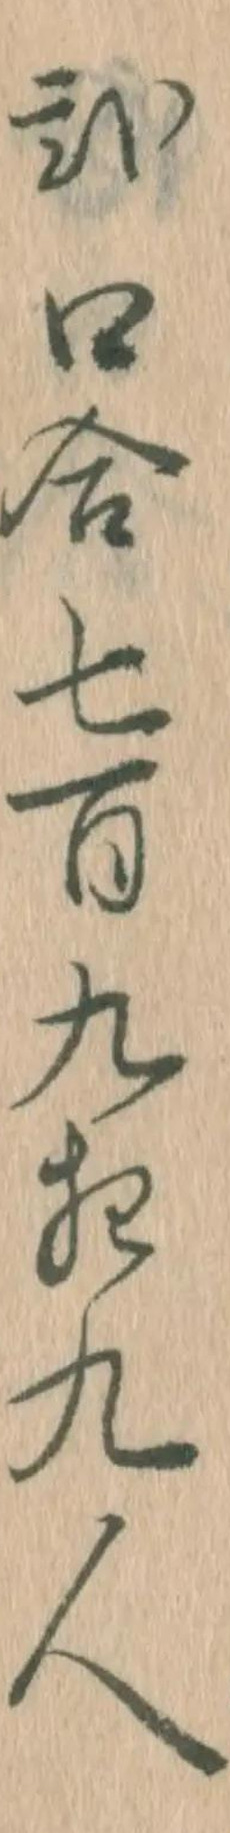弐口合七百九拾九人
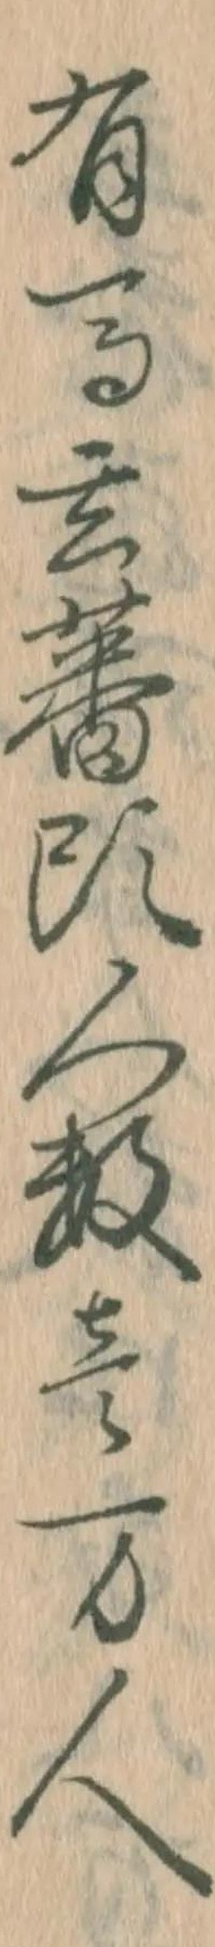有馬玄蕃頭人数壱万人
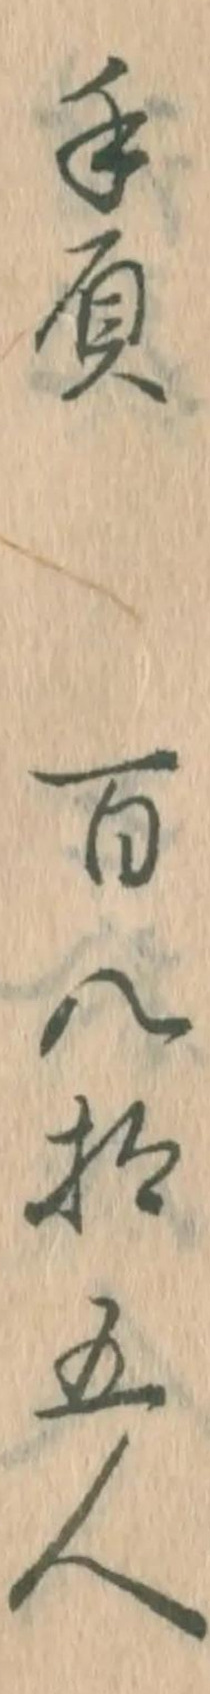手負百八拾五人

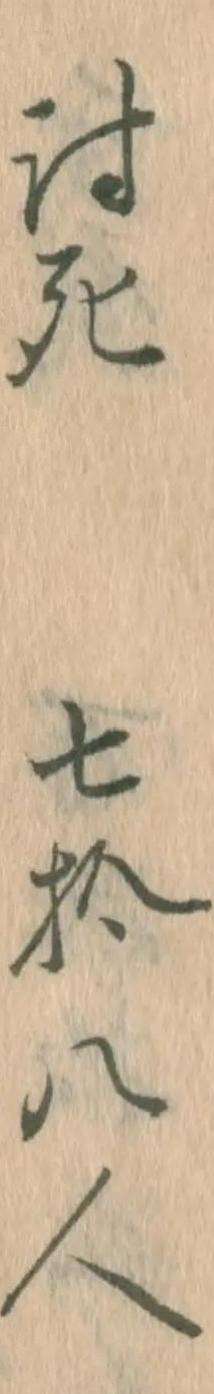討死七拾八人
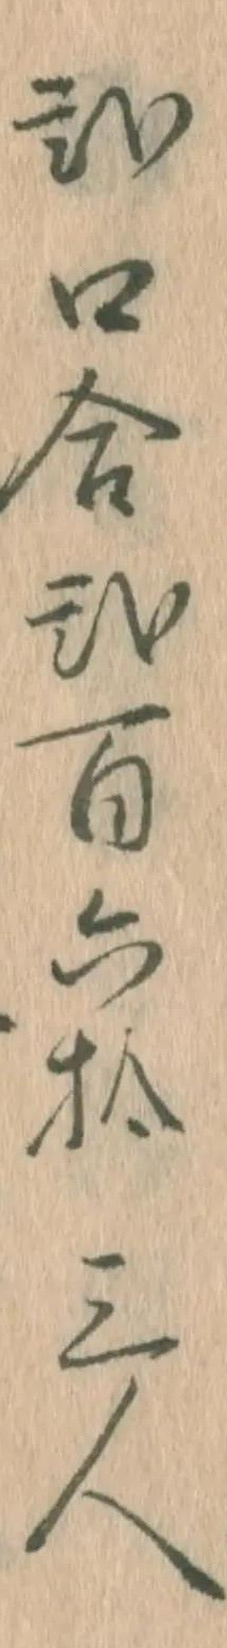弐口合弐百六拾三人
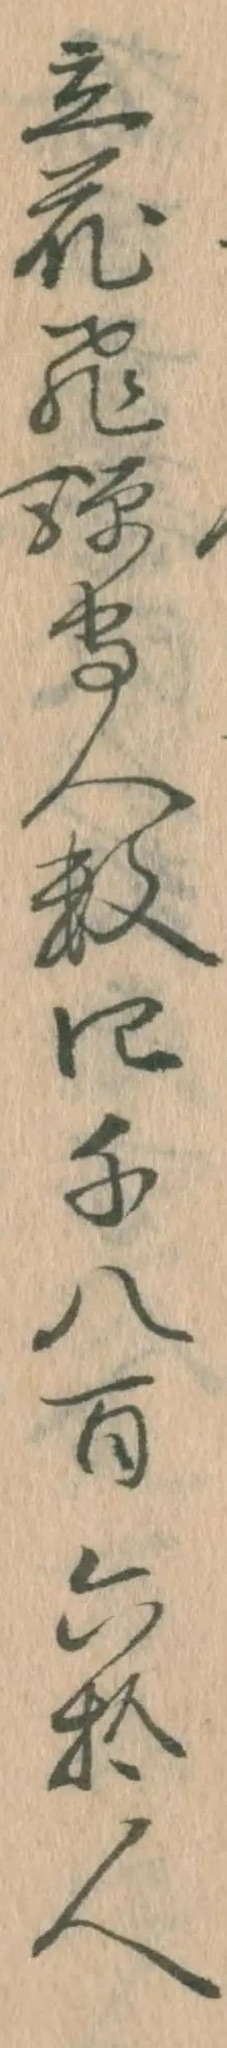立花飛騨守人数四千八百六拾人
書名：切支丹御退治記 49巻. [9]
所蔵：国立国会図書館 National Diet Library, JAPAN
